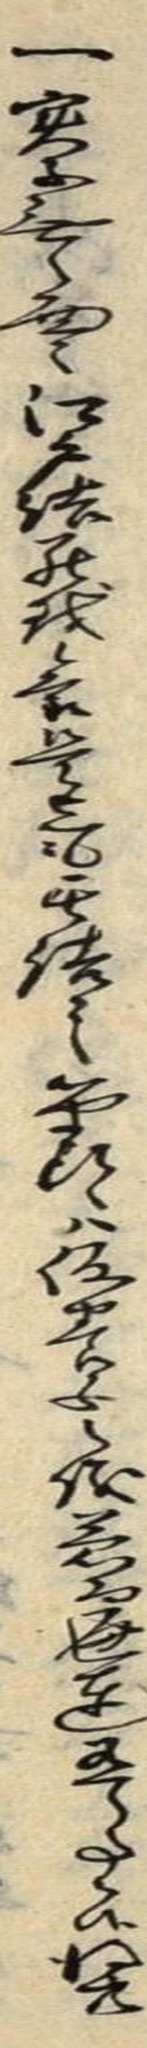一実子無之面々江戸詰罷越候節是迄も其詰之筆頭へハ仮養子之儀兼而通達有之事ニ候得共
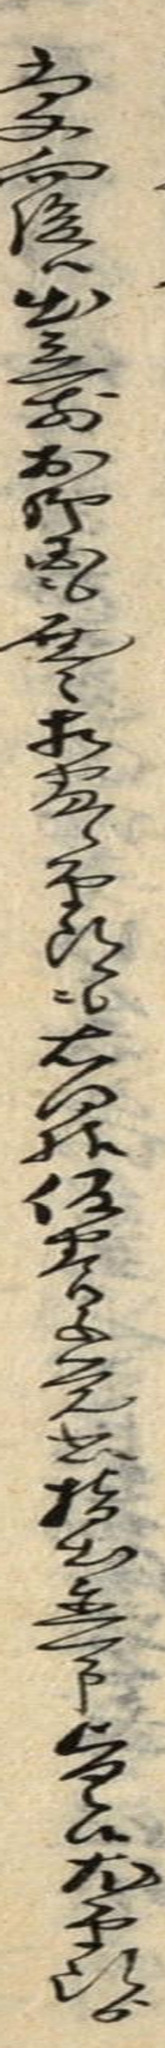尚又向後ハ出立前於御国も面々相番之筆頭へも右同様仮養子覚書指出置可申旨ニ候尤筆頭ゟ
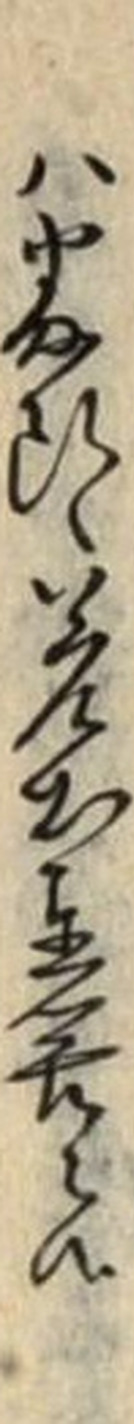ハ番頭へ差出置筈ニ候
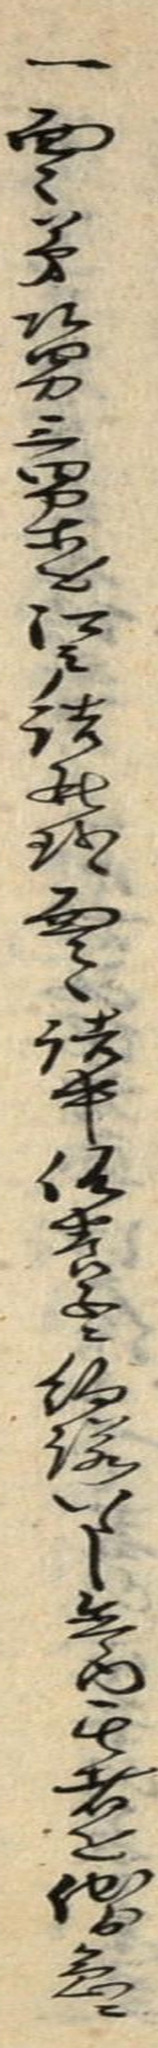一面々弟次男三男等を江戸詰罷越候面々へ詰中仮養子ニ約議いたし置候内其者を他ゟ急ニ

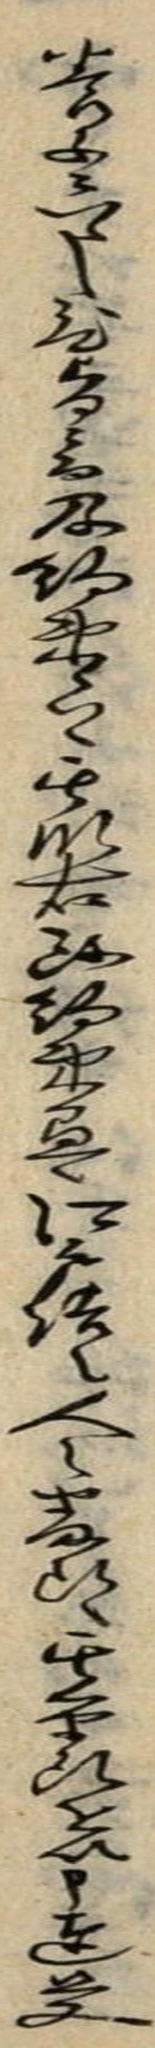養子ニいたし度旨ニ而及約束候ハゝ其段右致約束置候江戸詰之人之番頭へ其筆頭を以申達且又
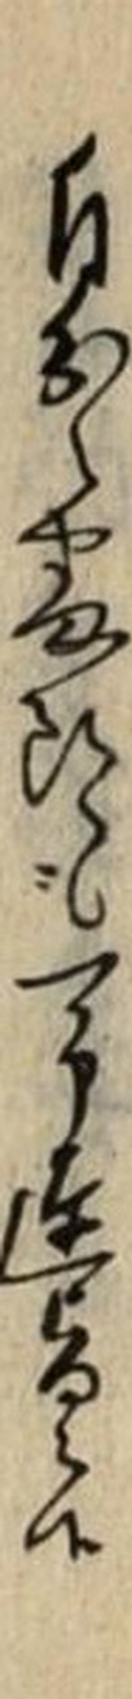自分之番頭へも可申達旨ニ候
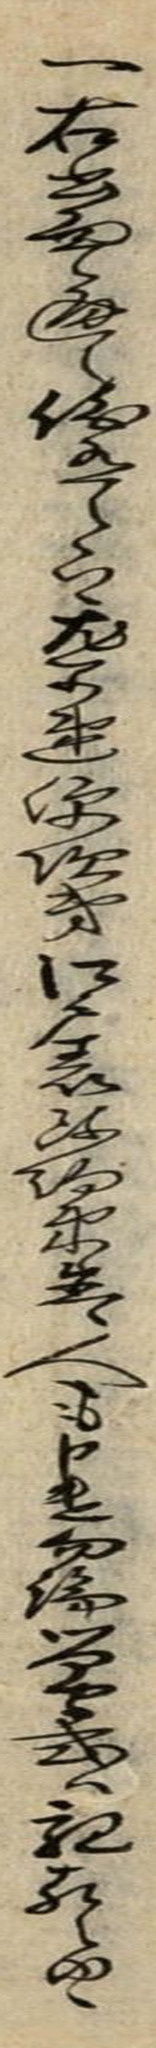一右書面之通之儀有之候ハゝ尤早速便次第江戸表致約束置候人へも申遣勿論留守或は親類之内へ
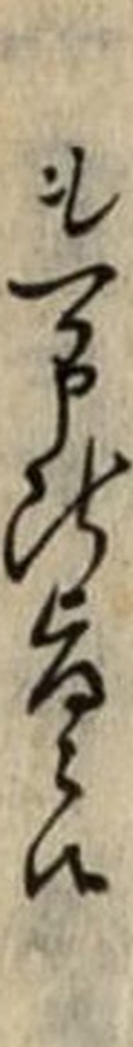も可申断旨ニ候
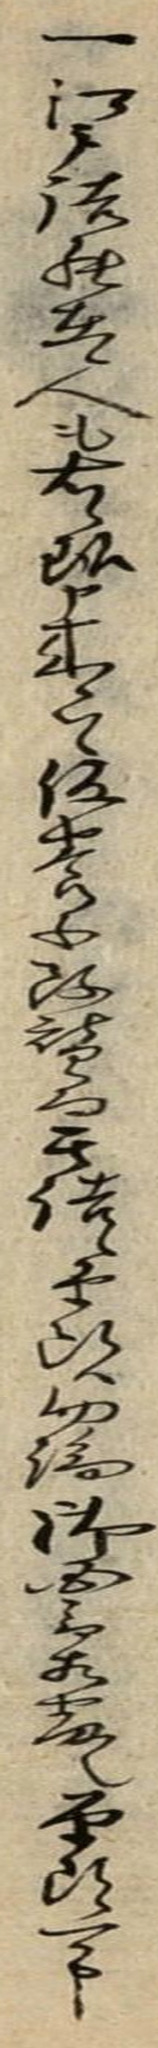一江戸詰罷在候人も右之趣申来候ハゝ仮養子致替候而其詰之筆頭ハ勿論御国ニ而相番之筆頭へ可申
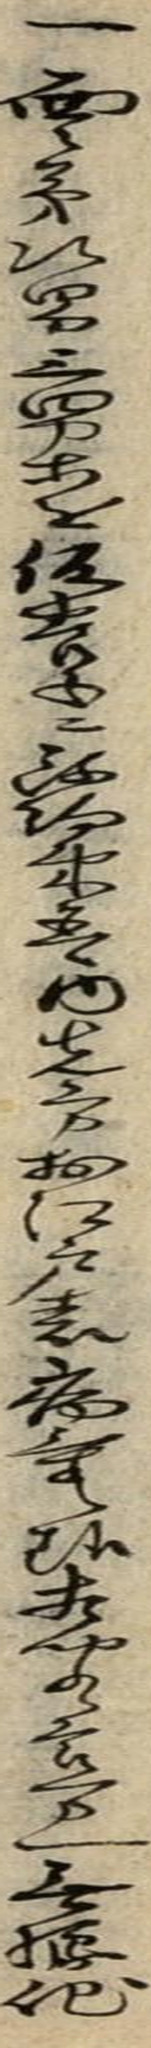一面々弟次男三男等を仮養子ニ致約束置候内先方於江戸表病気之趣相聞候節万一無拠他
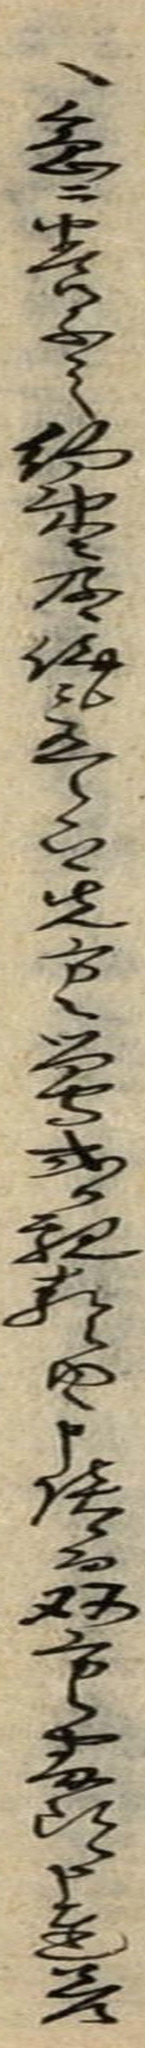急ニ養子之約束ニ及候儀も有之ハヽ先方之留守或ハ親類之内へ申談候而双方之番頭へ申達差
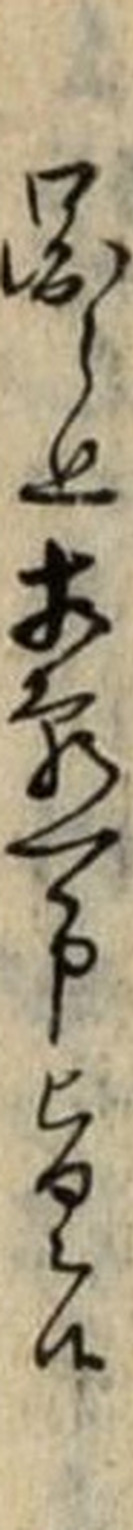図之上相願可申旨ニ候
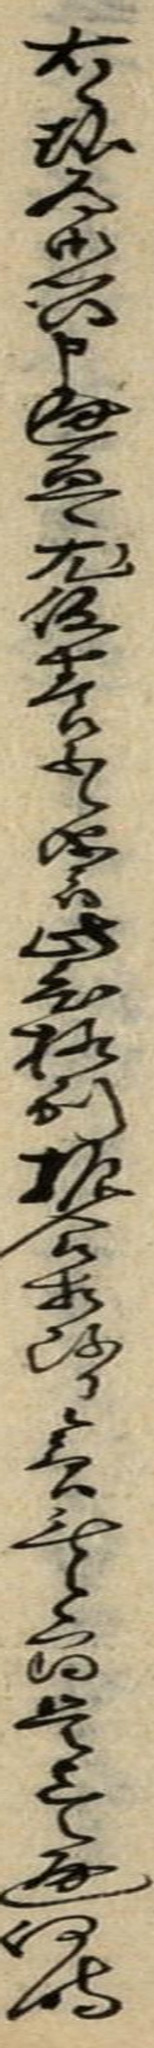右之趣為御心得申通置候尤仮養子之儀ニ付此度格別振合相改り候ニ而ハ無之候間是迄之通何時
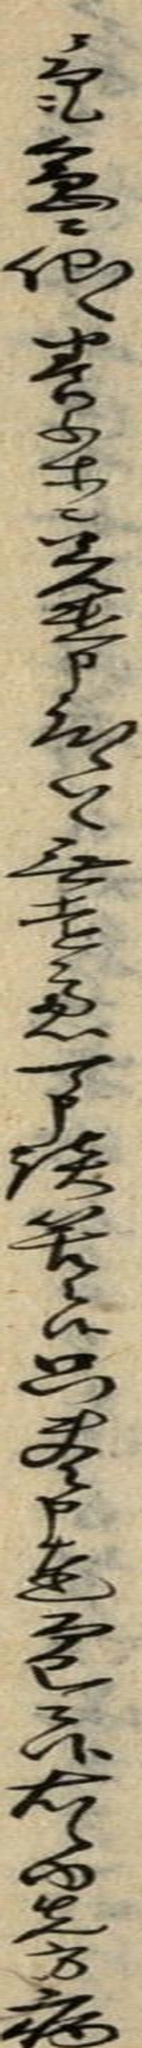ニ而も急ニ他へ養子等に差遣申度候ハヽ無遠慮可申談筈ニ候只夫々申達而已ニ候右之内先方病
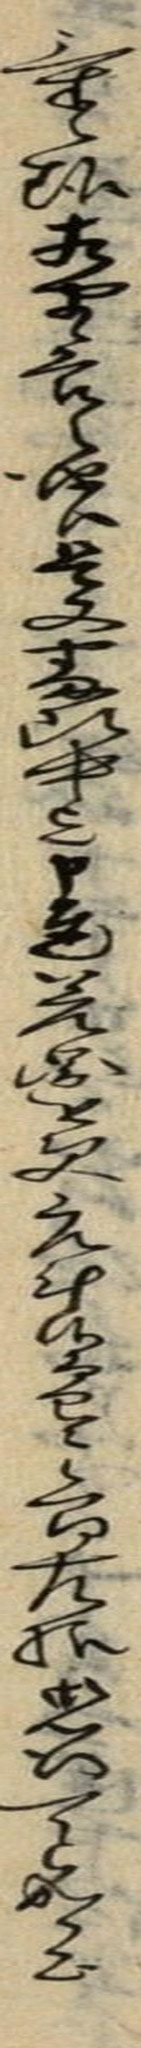気之趣相聞候節之儀ハ是又番頭中迄申達差図を受取計候而已ニ候間左様御心得可被成候以上
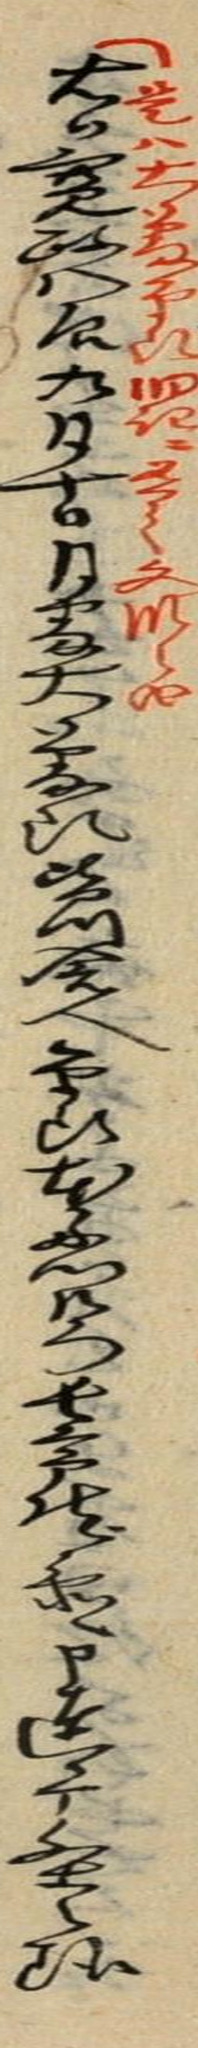右ハ寛政八辰九月十日月番大御番頭皆川舎人筆頭本多門左衛門長谷部次郎兵衛ヘ申達候ケ条之趣
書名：養子縁組之部
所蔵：福井県文書館 Fukui Prefectural Archives
